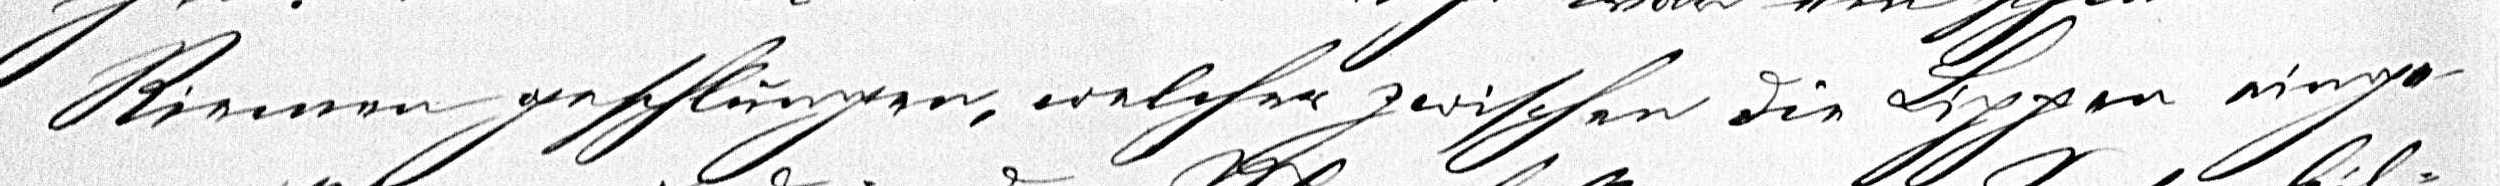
Riemen geschlungen, welcher zwischen die Lippen einge¬
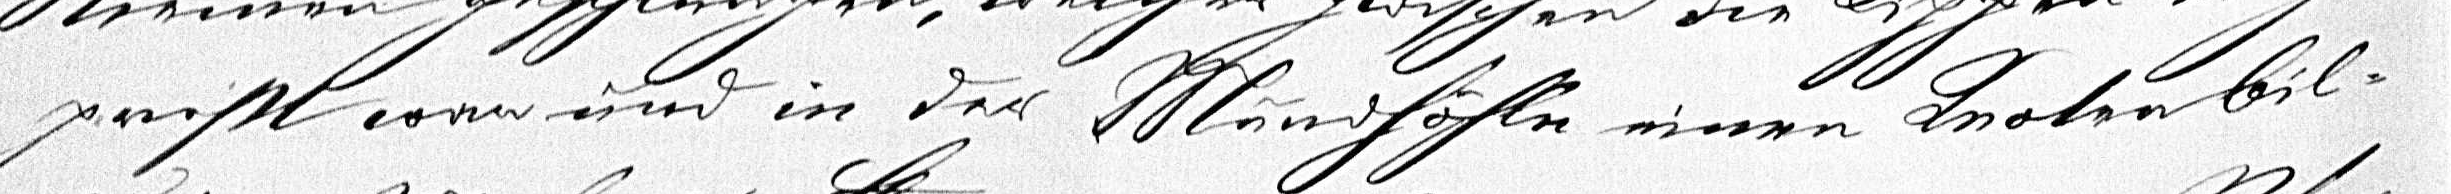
preßt war und in der Munchhöhle einen Knoten bil¬
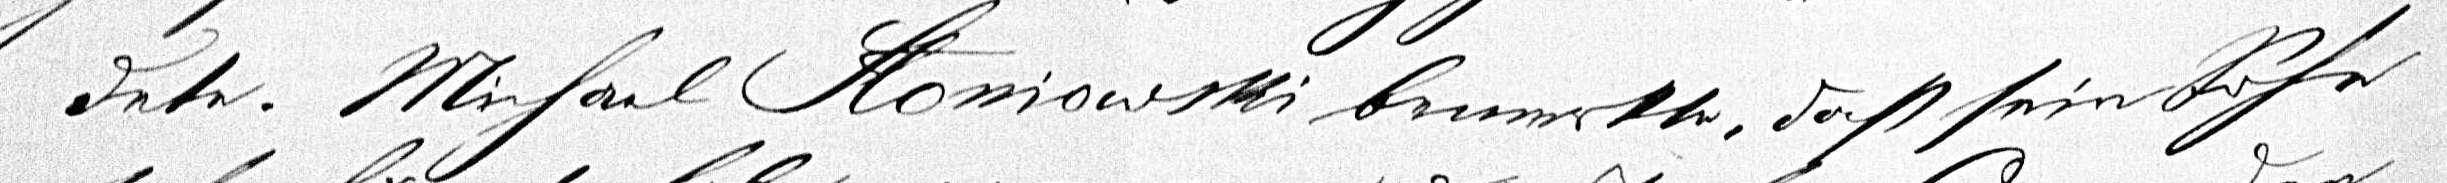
dete. Michael Stoniowski bemerkte, daß sein Sohn
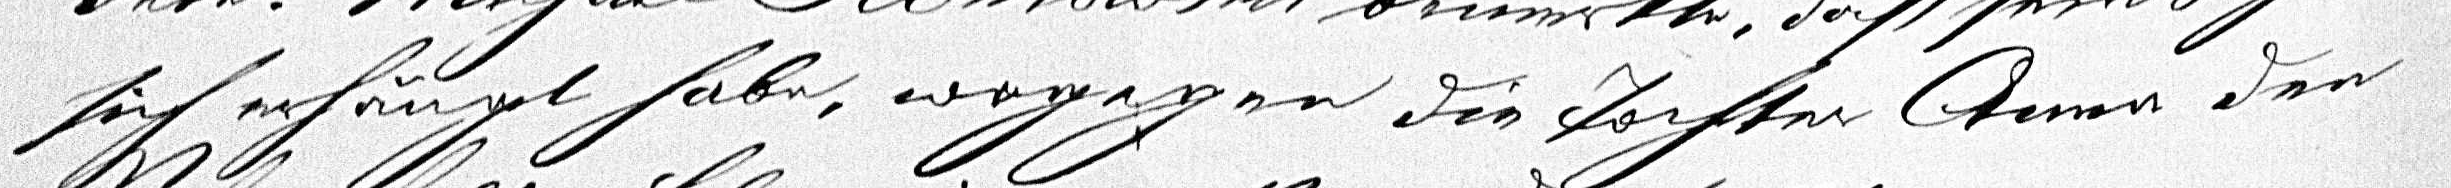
sich erhaupt habe, wogegen die Tochter Anna den
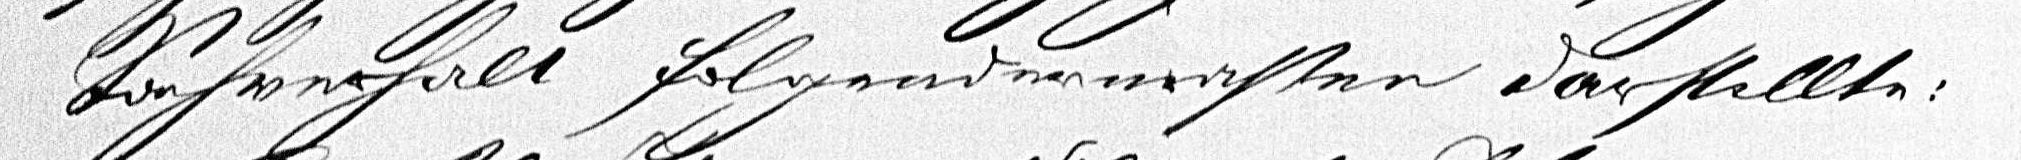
Sachverhalt Folgender maßen darstellte:
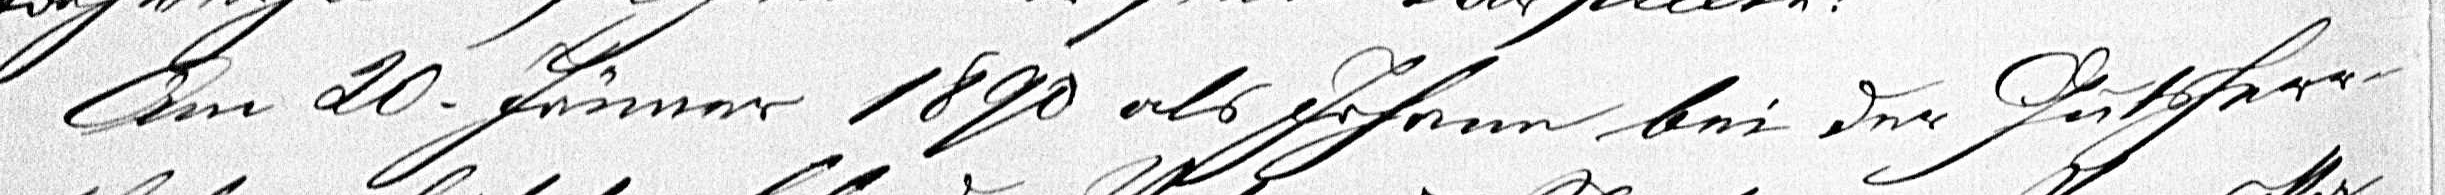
Am 20. Jänner 1890 als Johann bei der Gutsherr¬
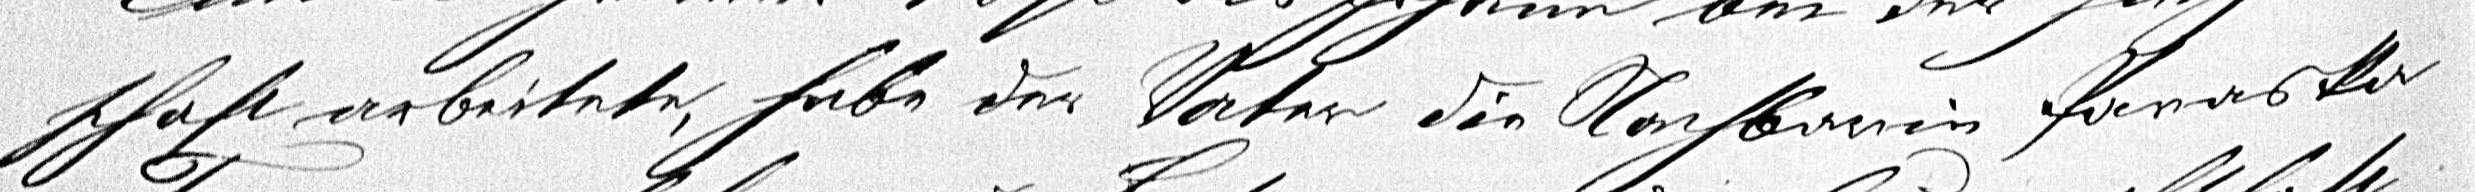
schaft arbeitete, habe der Vater die Nachbarin Panaska
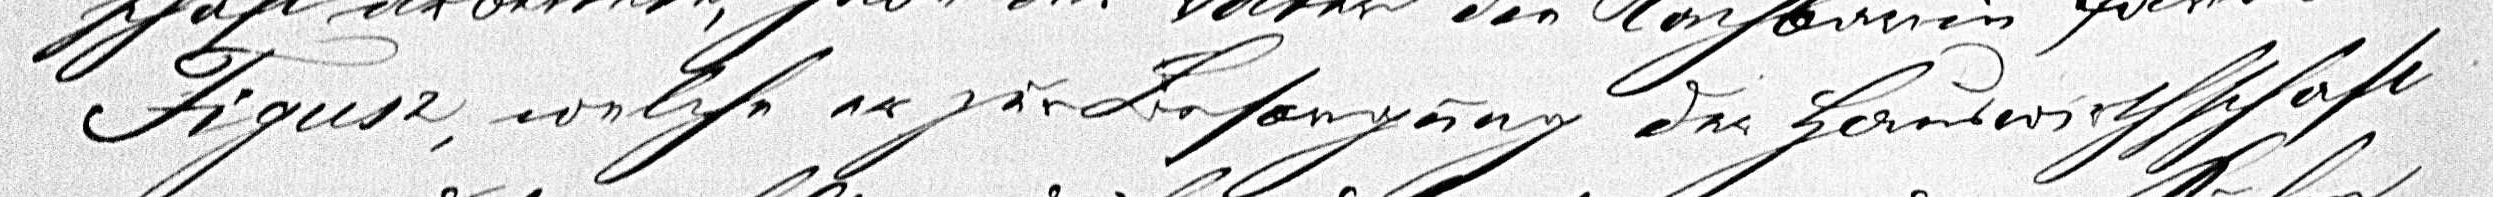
Figusz, welche er zur Besorgung der Hauswirthschaft
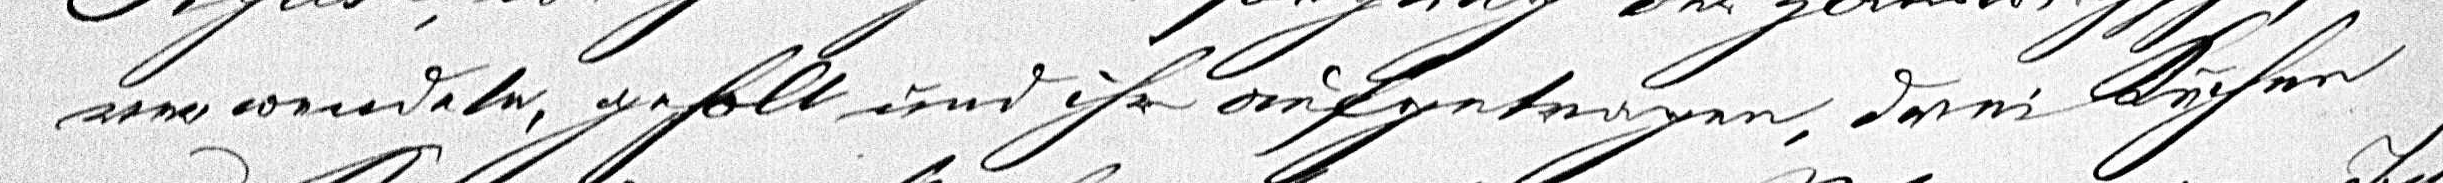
verwendete, geholt und ihr aufgetragen, drei Kuchen
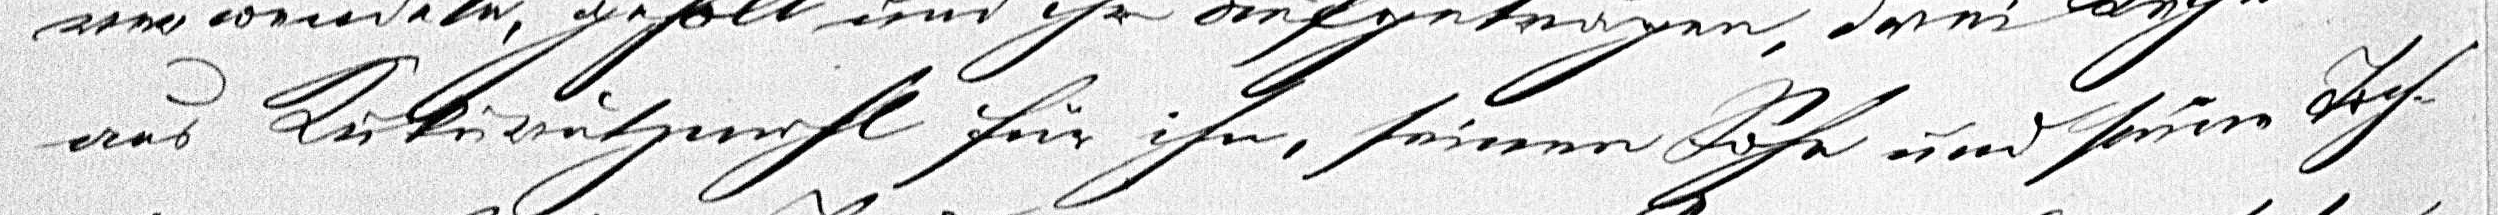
aus xxmehl für ihn, seinen Sohn und seine Toch¬
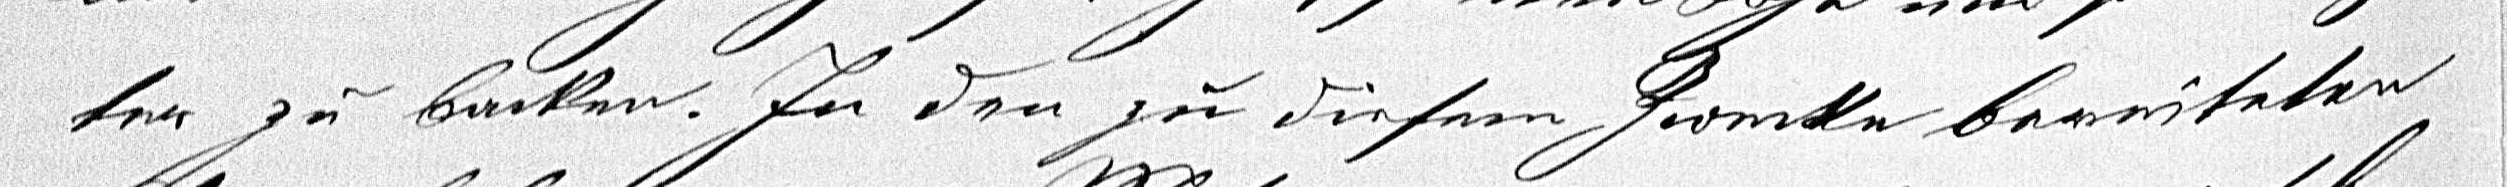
ter zu backen. Jn den zu diesem Zwecke bereiteten
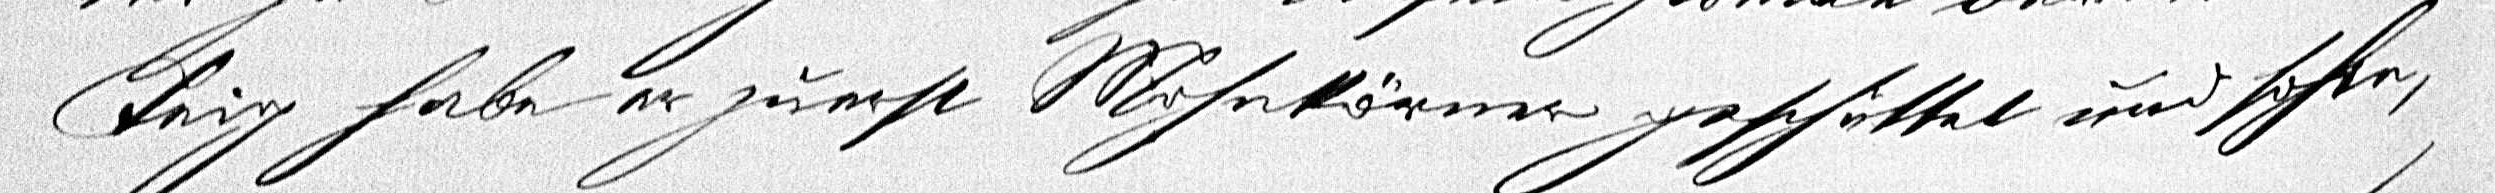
Teig habe er zuerst Mohnkörner geschüttet und sohin,
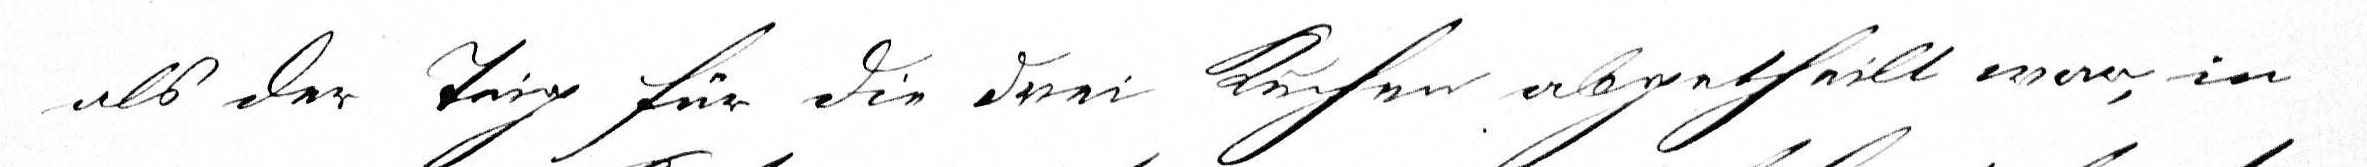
als der Teig für die drei Kuchen abgetheilt war, in
